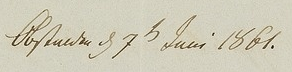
Obstalden den 7ten Juni 1861.
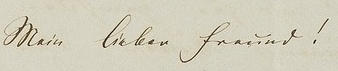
Mein lieber Freund!
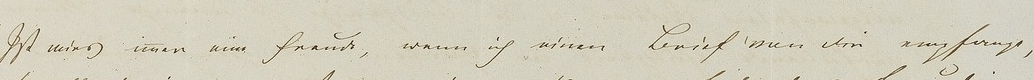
Ist mirs immer eine Freude, wenn ich einen Brief von dir empfange,
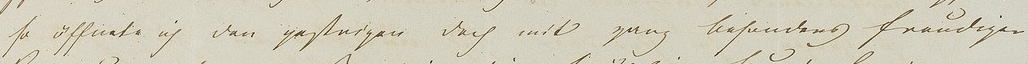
so öffnete ich den gestrigen doch mit ganz besonders freudiger
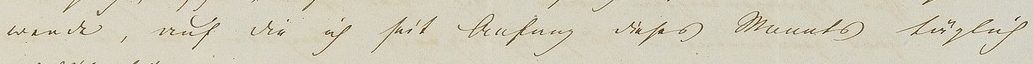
werde, auf die ich seit Anfang dieses Monats täglich
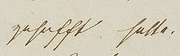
gehofft hatte.
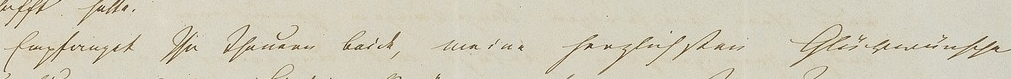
Empfanget Ihr Theuern beide, meine herzlichsten Glückwünsche
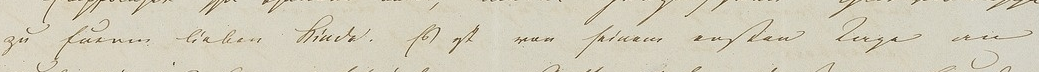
zu Euerm lieben Kinde. Es ist von seinem ersten Tage an
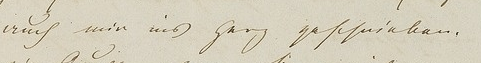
auch mir ins Herz geschrieben.
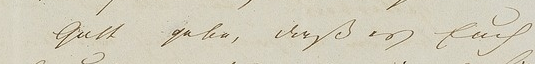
Gott gebe, daß es Euch
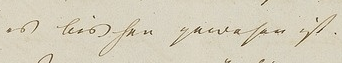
es bisher gewesen ist.
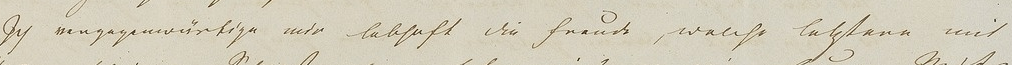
Ich vergegenwärtige mir lebhaft die Freude, welche letztere mit
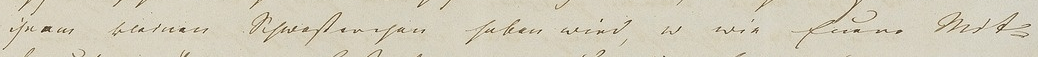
ihrem kleinen Schwesterchen haben wird, & wie Euere Mit-
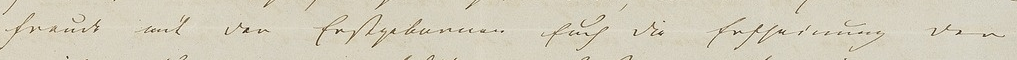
freude mit der Erstgebornen Euch die Erscheinung der
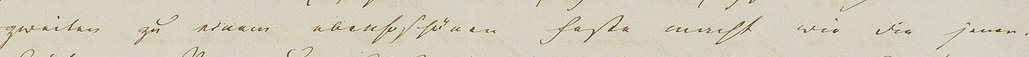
zweiten zu einem ebensoschönen Feste macht wie die jener.
